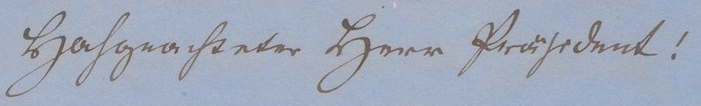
Hochgeachteter Herr Präsident!
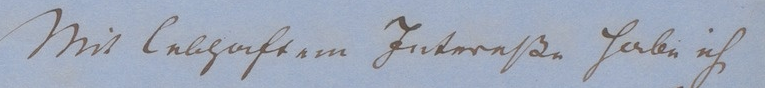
Mit lebhaftem Intereße habe ich
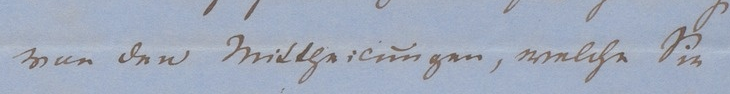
von den Mittheilungen, welche Sie
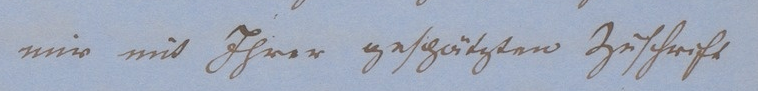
mir mit Ihrer geschätzten Zuschrift
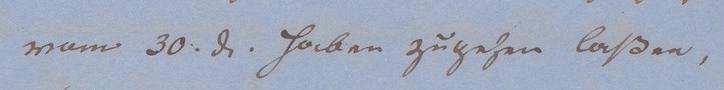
vom 30. d. haben zugehen laßen,
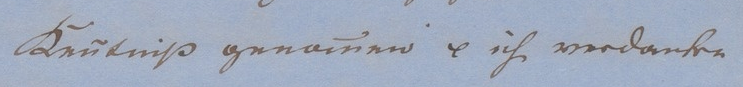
Kenntniß genommen & ich verdanke
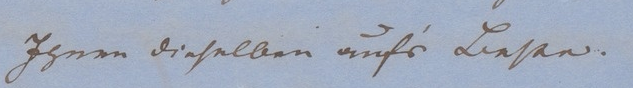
Ihnen dieselben auf's Beste.
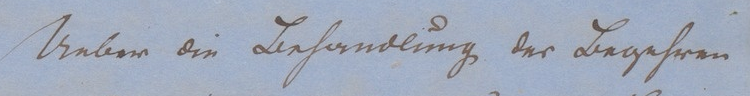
Ueber die Behandlung der Begehren
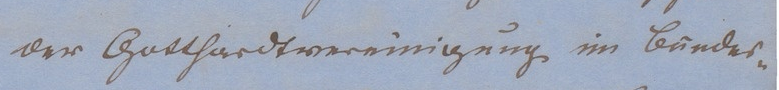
der Gotthardtvereinigung im Bundes-
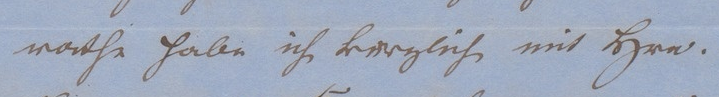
rathe habe ich kürzlich mit Hrn.
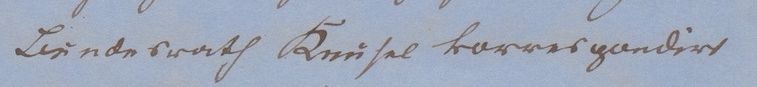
Bundesrath Knüsel korrespondirt
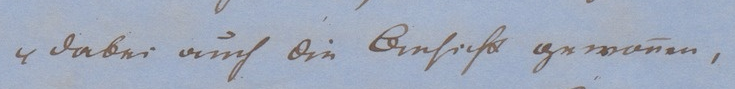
& dabei auch die Ansicht gewonnen,
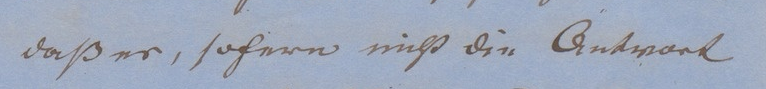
daß es, sofern nicht die Antwort
